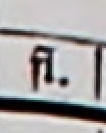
fl.
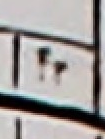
kr.
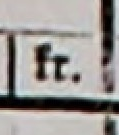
kr.
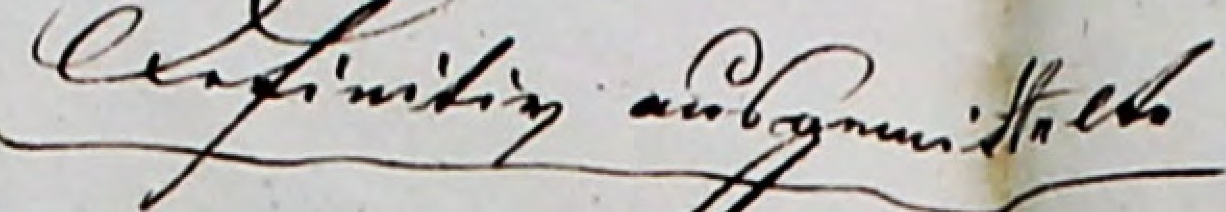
Definitiv ausgemittelte
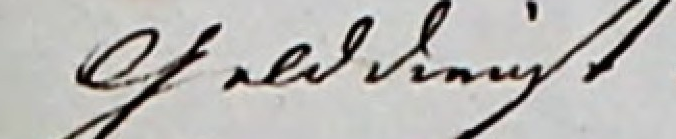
Gelddienst
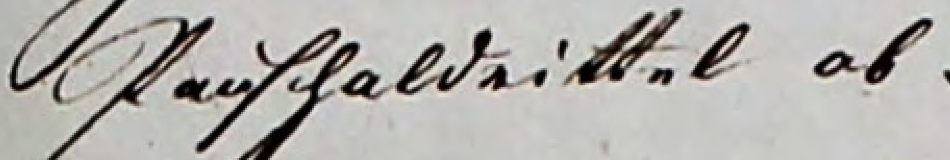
Panschaldrittel ab
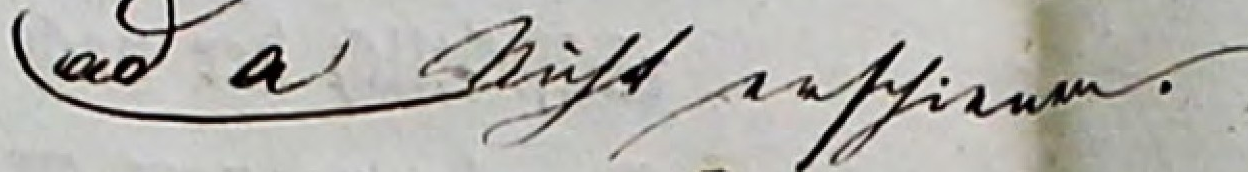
ad 3 Nicht erschienen.
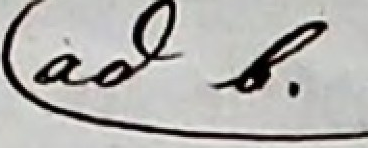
ad b.
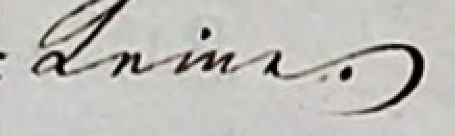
Keine.
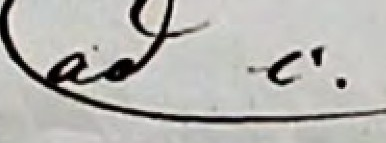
ad c.
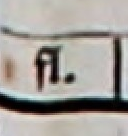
fl.
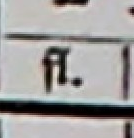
fl.
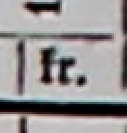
kr.
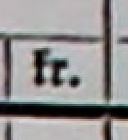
kr.
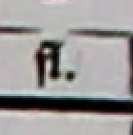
fl.
